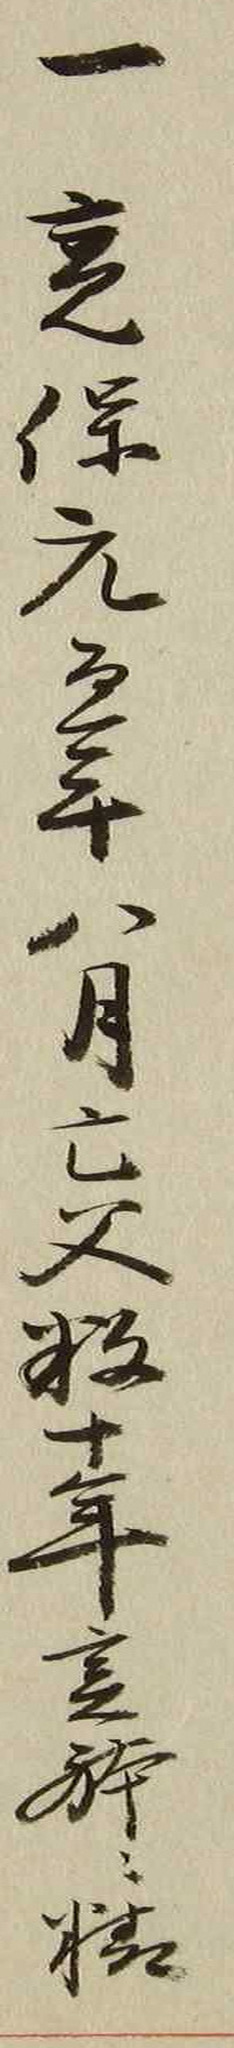一寛保元酉年八月亡父数十年実体ニ精
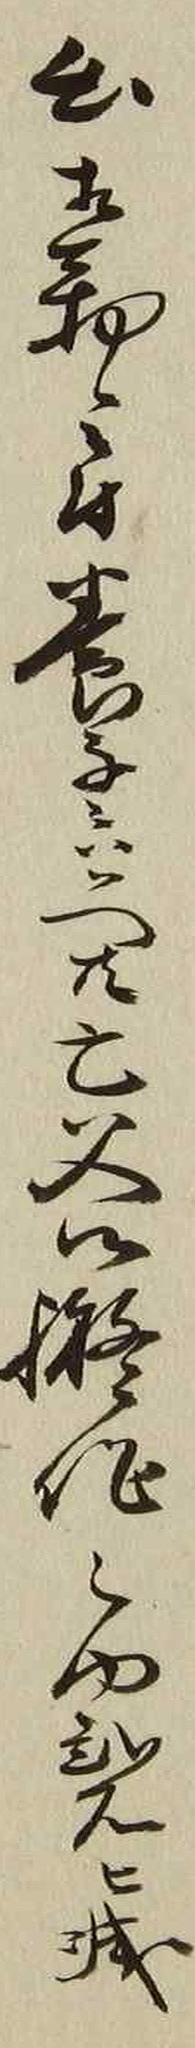出相勤候ニ付養子ニハ候へ共亡父御擬作之内弐石被減
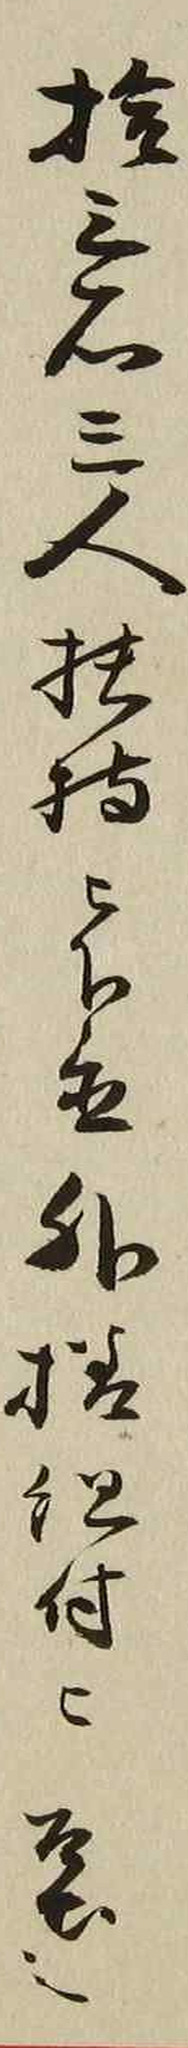拾三石三人扶持被下置外様組付被召出之
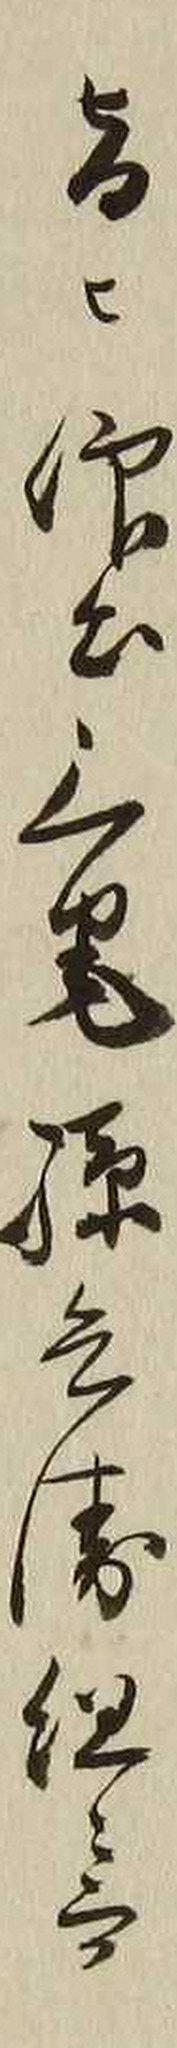旨被仰出三宅孫兵衛組ニ而
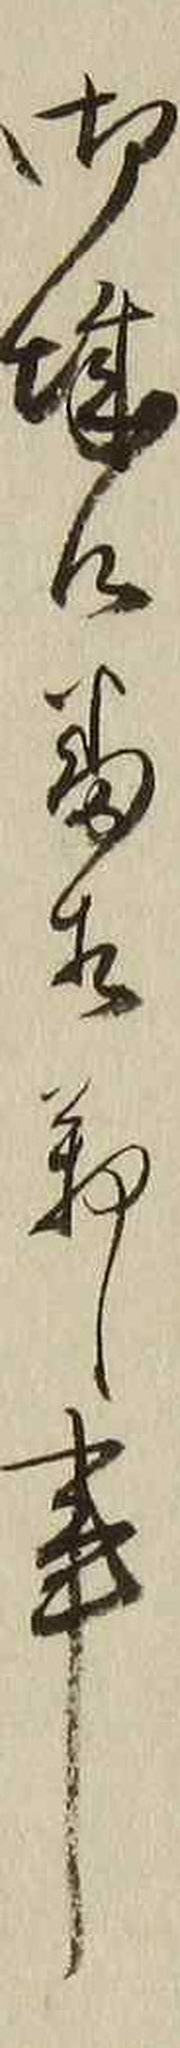御城御番相勤候事
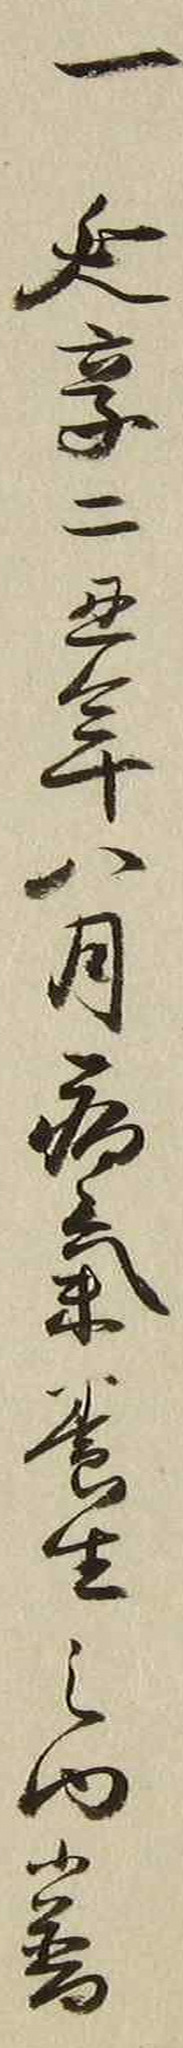一延享二丑年八月病気養生之内小普
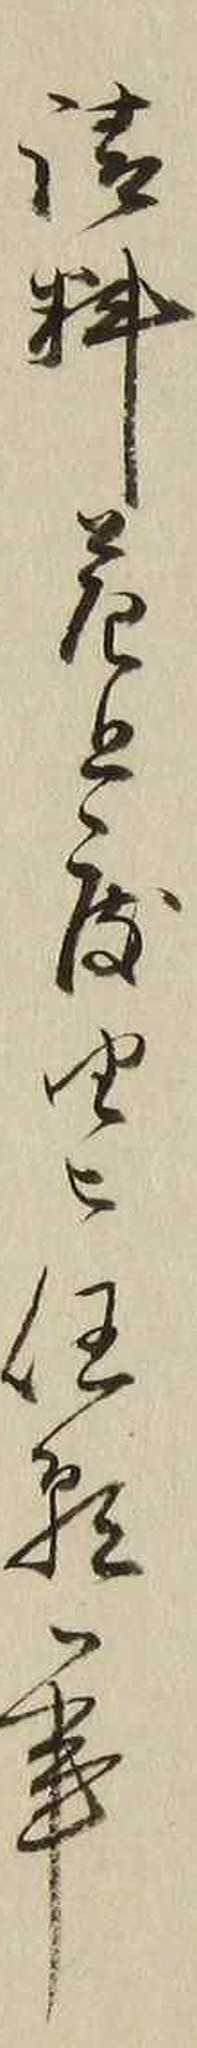請料差上度由被任願候事
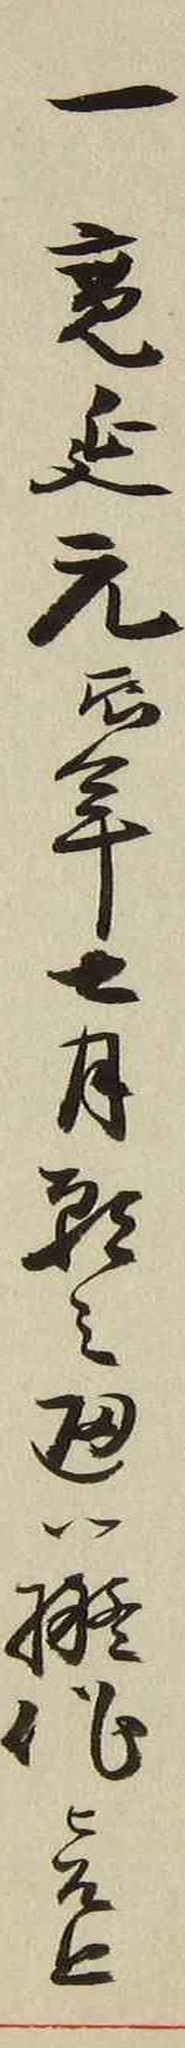一寛延元辰年七月願之通御擬作被召上
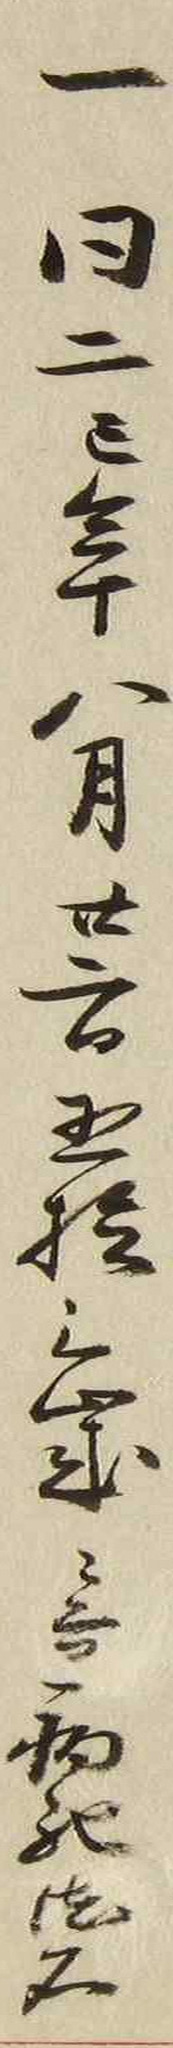一同二巳年八月廿二日五拾三歳ニ而病死法名
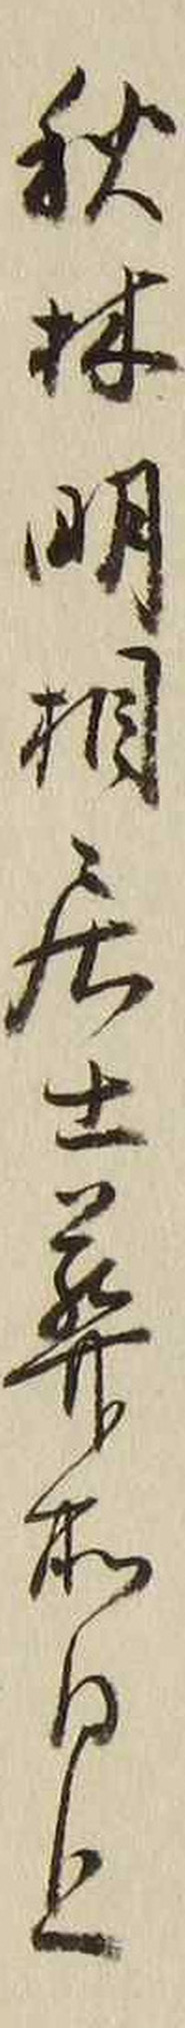秋林明相居士葬所同上

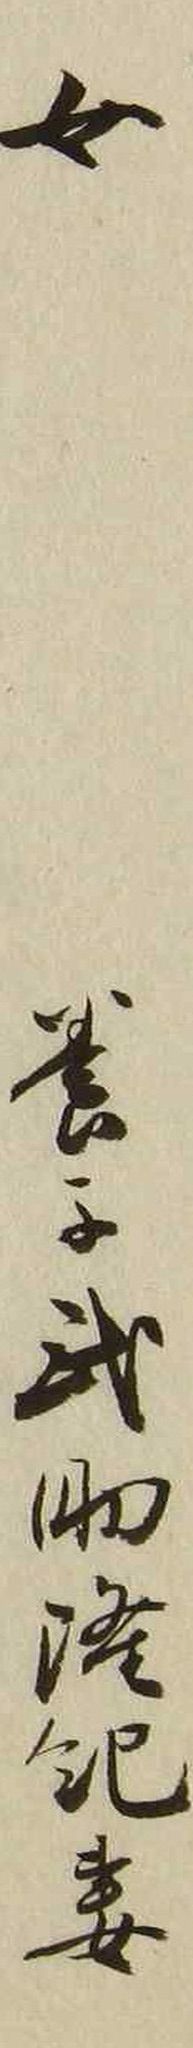女養子武助隆紀妻
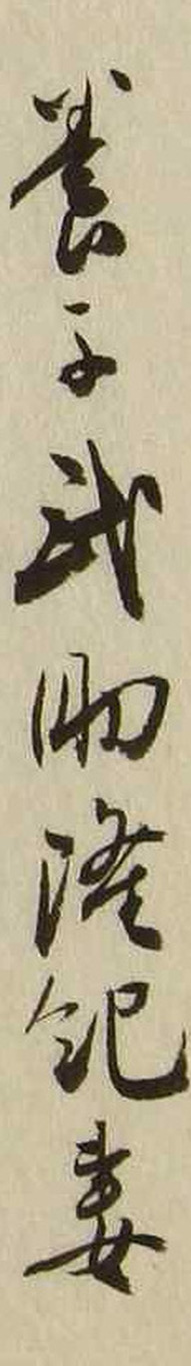女養子武助隆紀妻
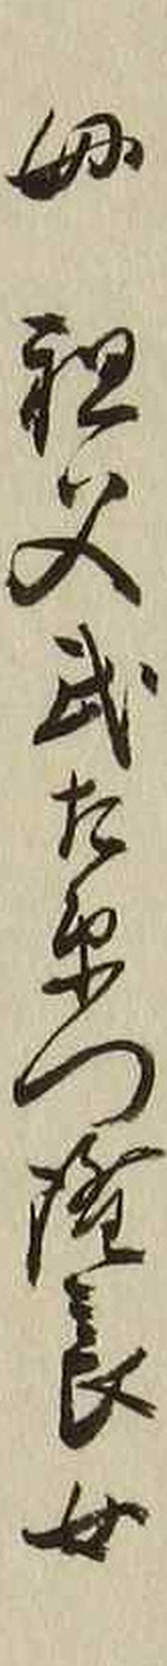母祖父武左衛門隆良女
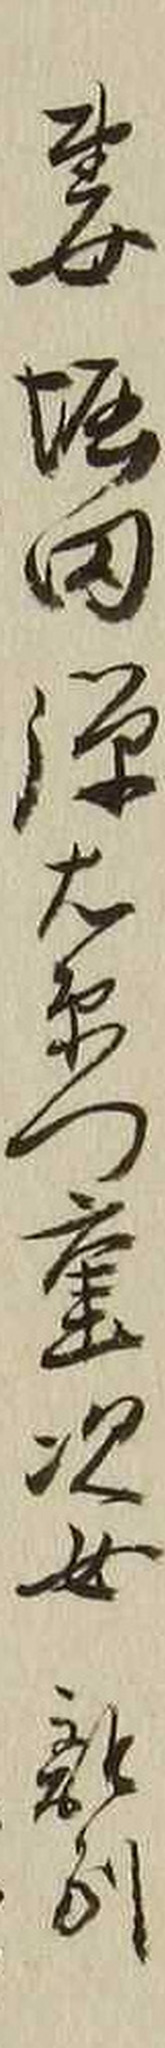妻堀田弾右衛門重次女離別
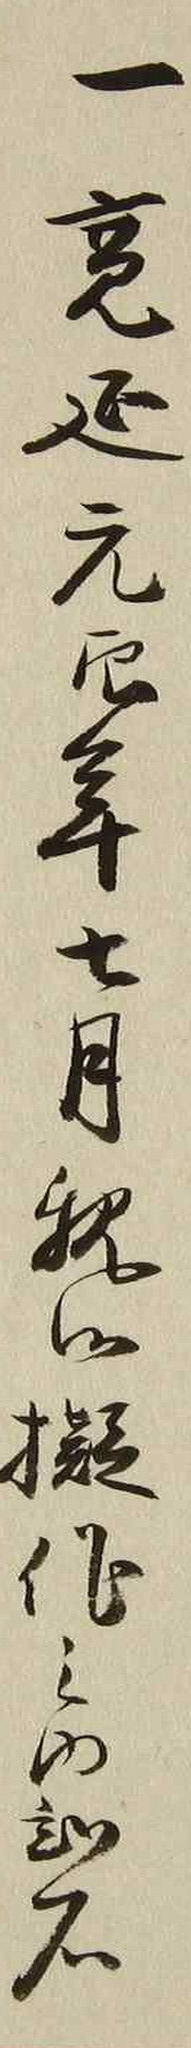一寛延元辰年七月親御擬作之内弐石
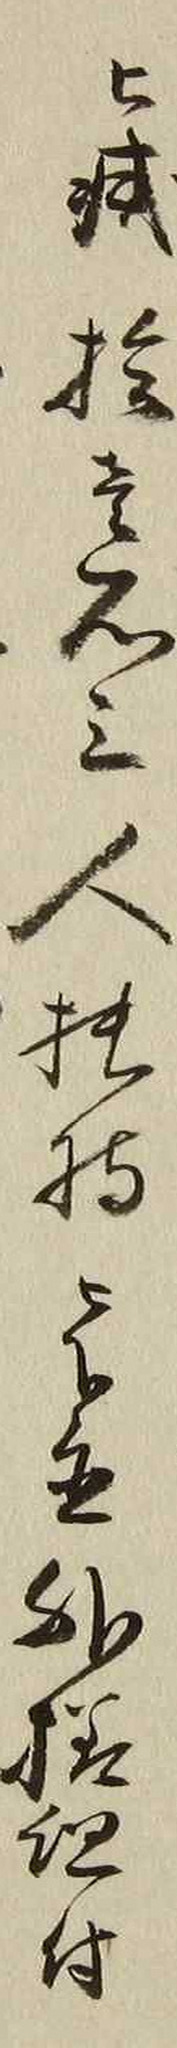被減拾壱石三人扶持被下置外様組付
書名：諸士系譜　巻之288　さ之部20
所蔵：会津若松市立会津図書館
